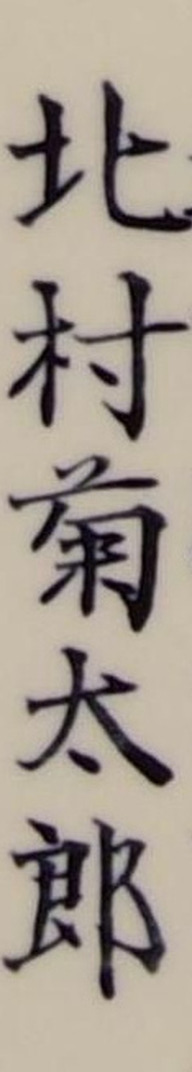北村菊太郎
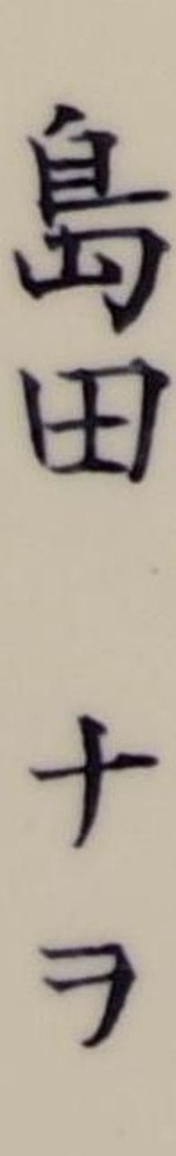島田ナヲ
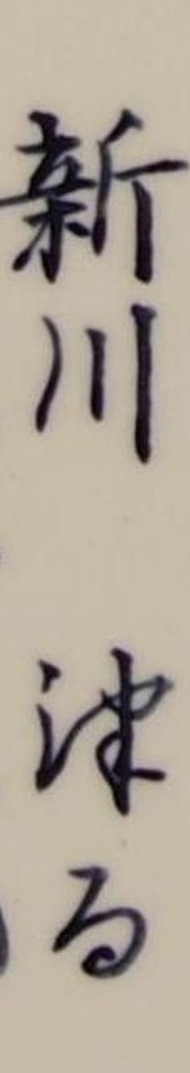新川つる
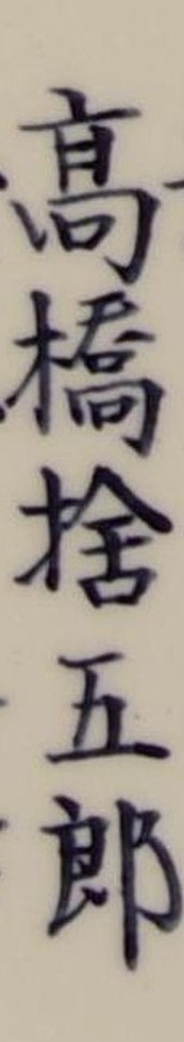高橋捨五郎
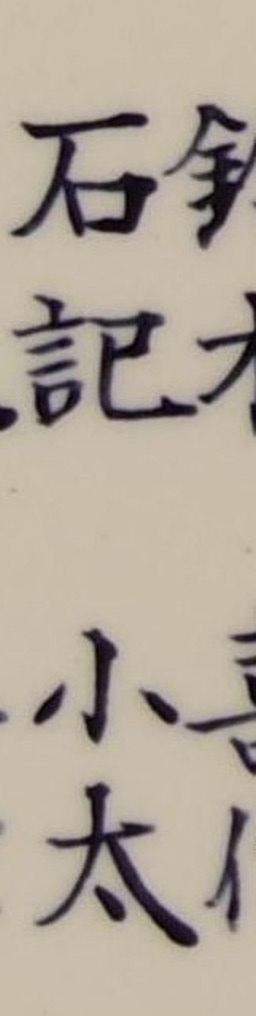石記小太

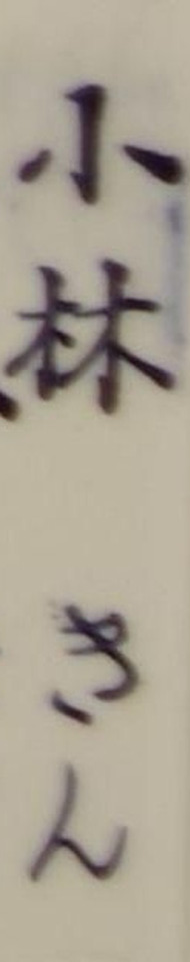小林きん
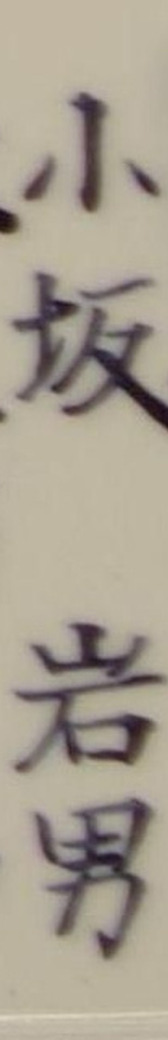小坂岩男
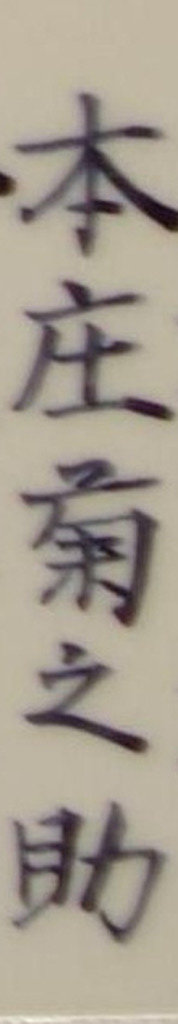本庄菊之助
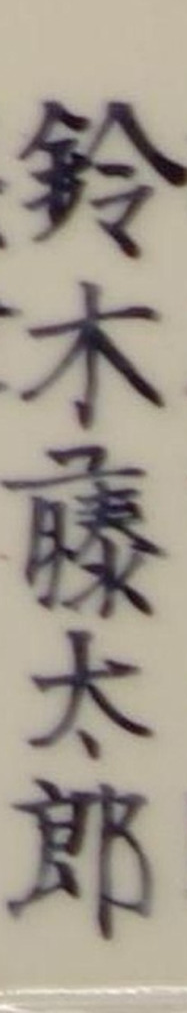鈴木藤太郎
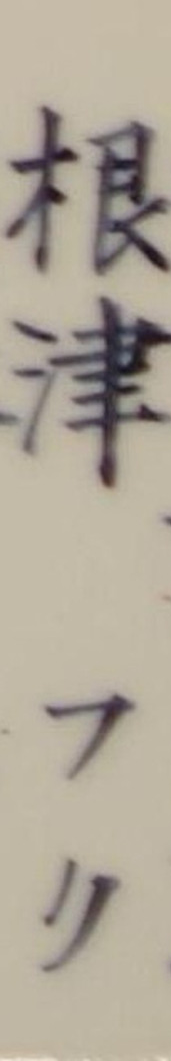根津フク
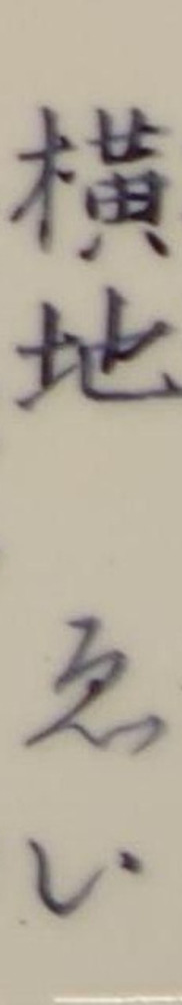横地えい
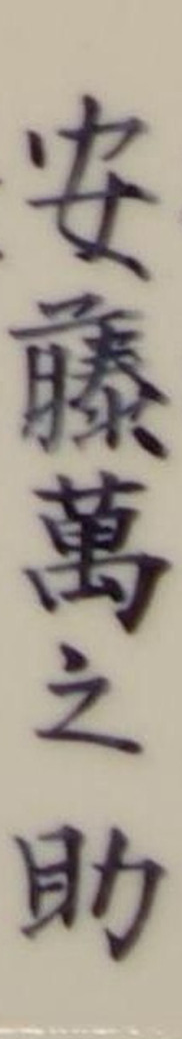安藤萬之助
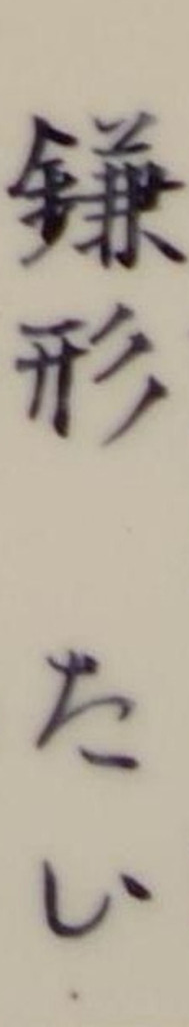鎌形たい
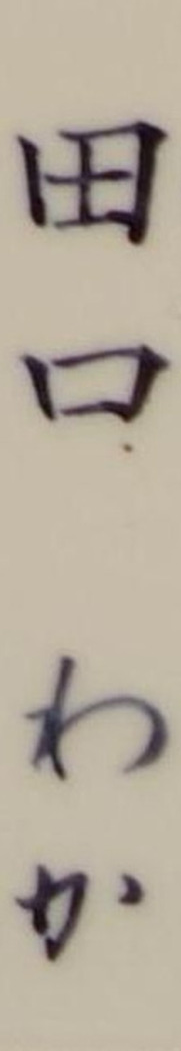田口わか
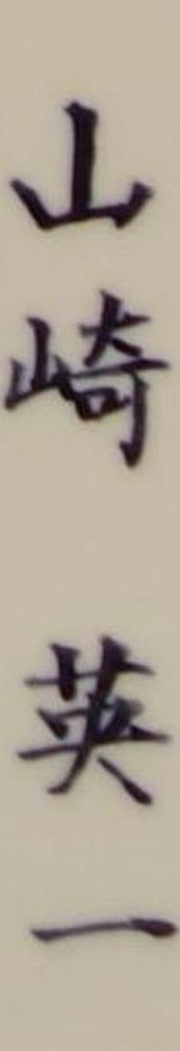山崎英一
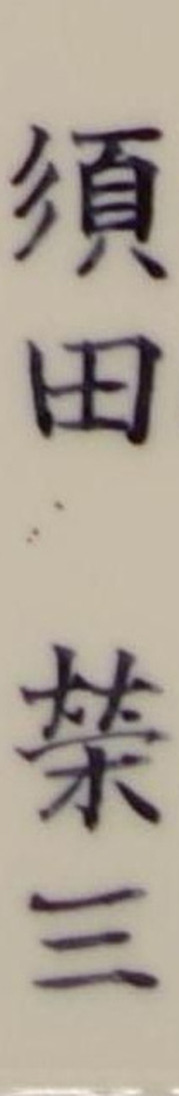須田榮三
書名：E~L
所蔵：高野山金剛峯寺
